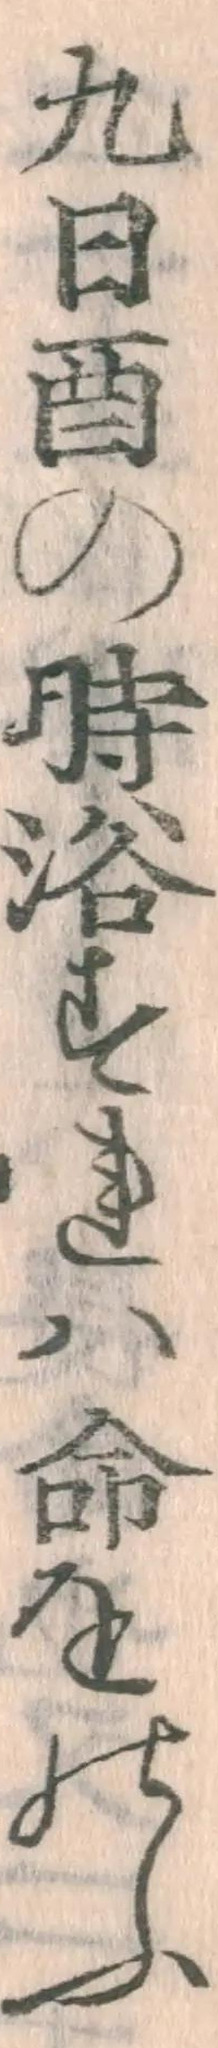九日酉の時浴すれは命をのふ
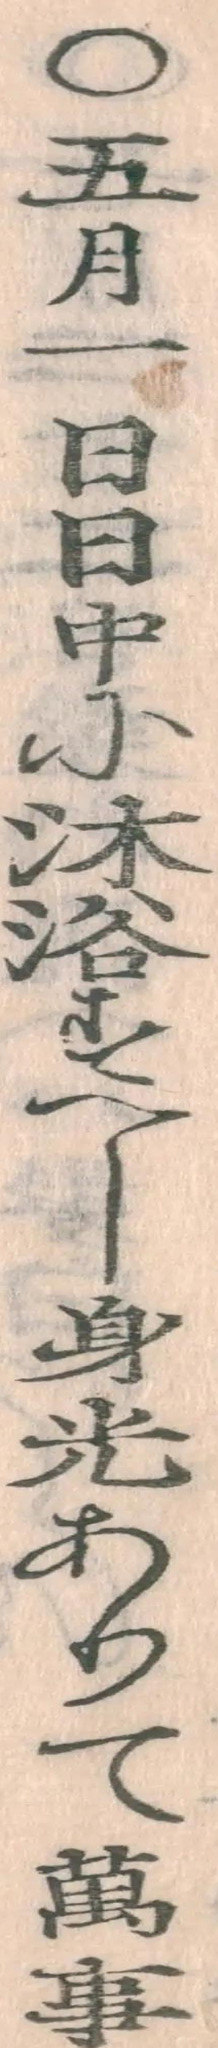〇五月一日日中に沐浴すへし身光ありて万事
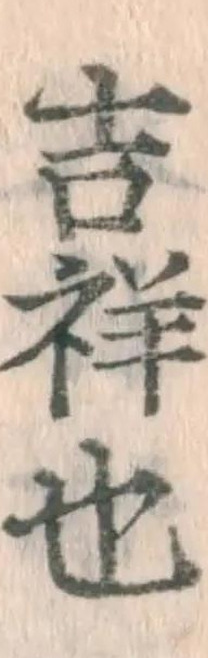吉祥也
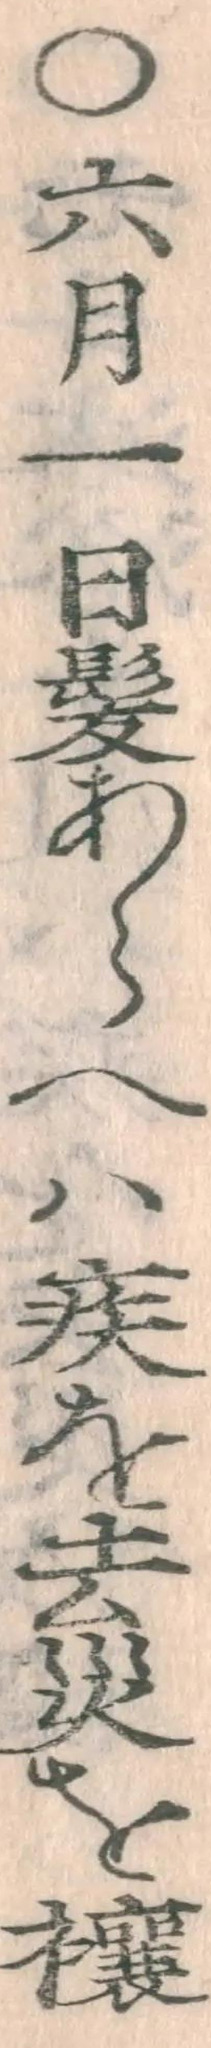〇六月一日髪あらへは疾を去災を禳
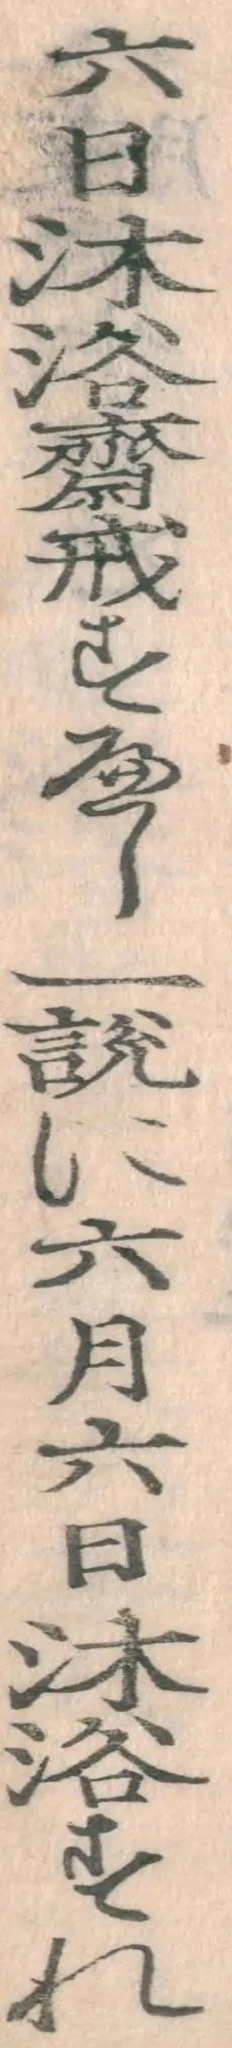六日沐浴斎戒すへし一説に六月六日沐浴すれ

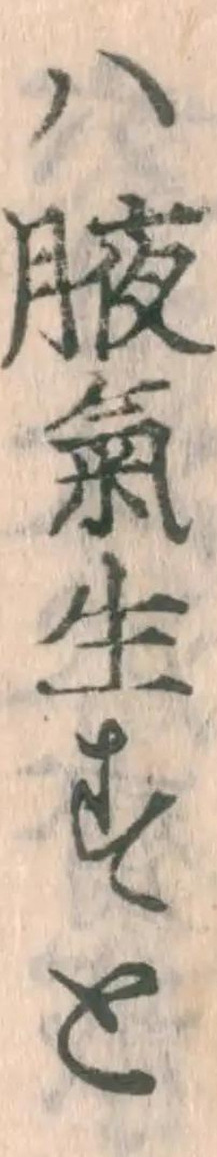は腋気生すと
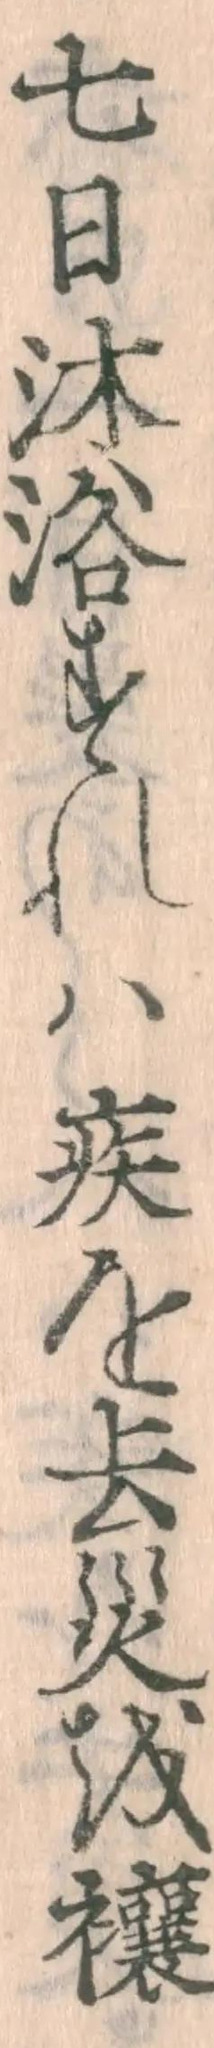七日沐浴すれは疾を去災を禳
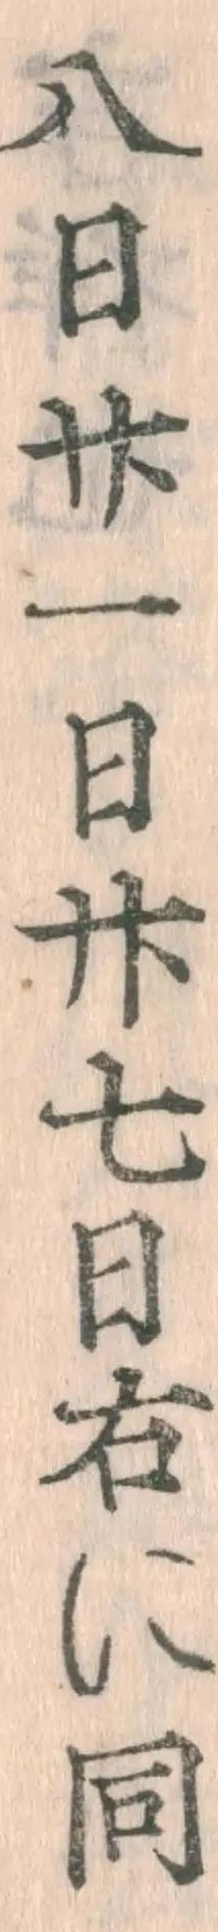八日廿一日廿七日右に同
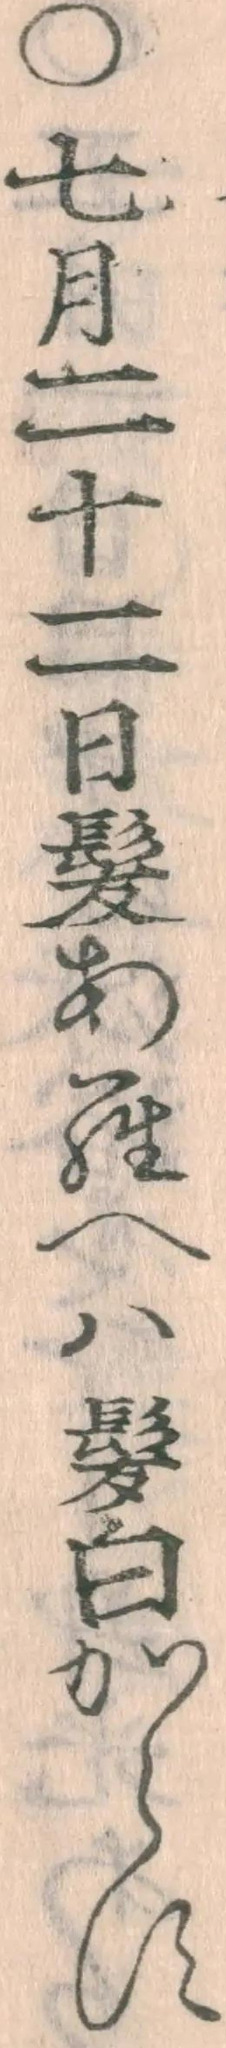〇七月二十二日髪あらへは髪白からす
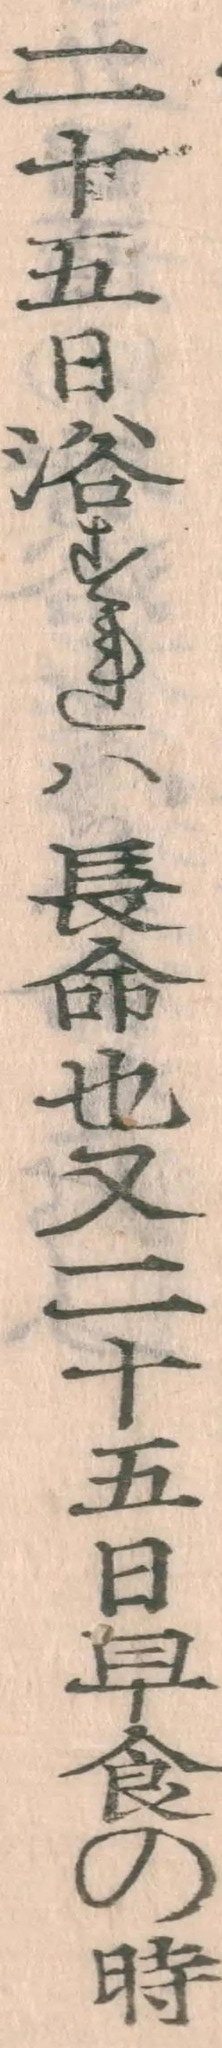二十五日浴すれは長命也又二十五日早食の時
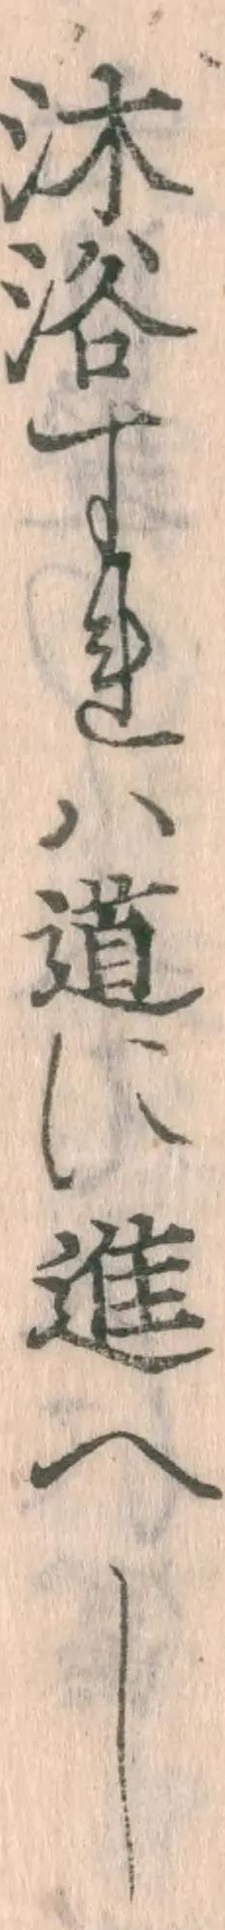沐浴すれは道に進へし
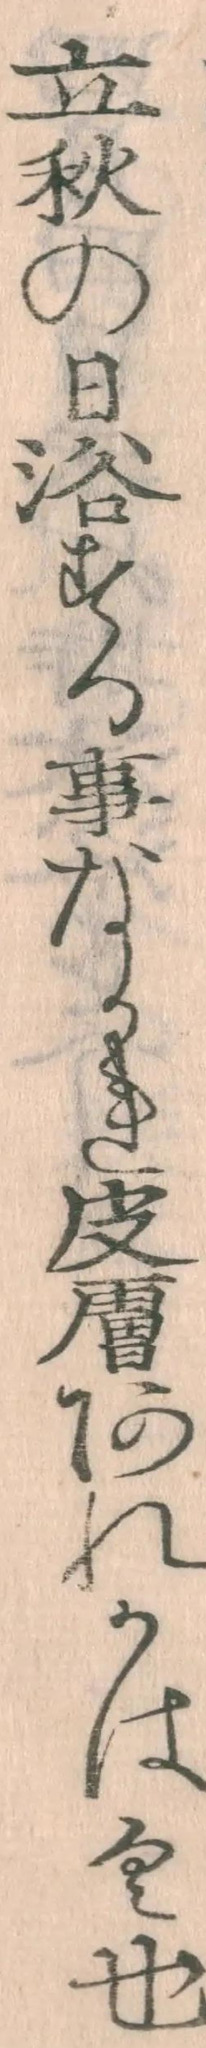立秋の日浴する事なかれ皮膚あれかはく也
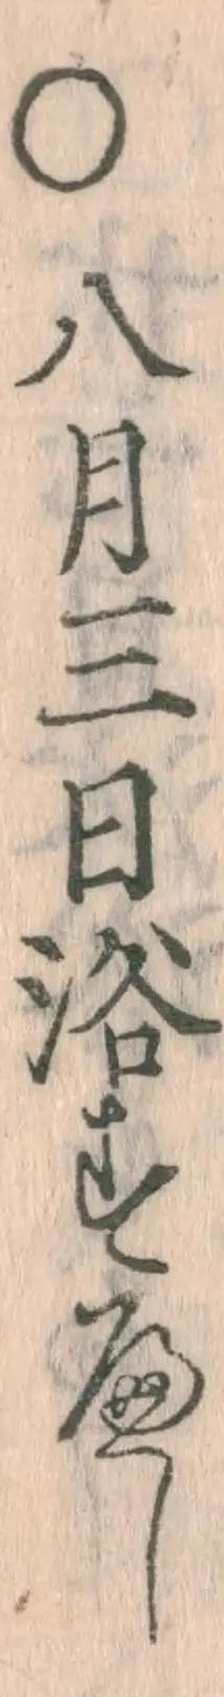〇八月三日浴すへし
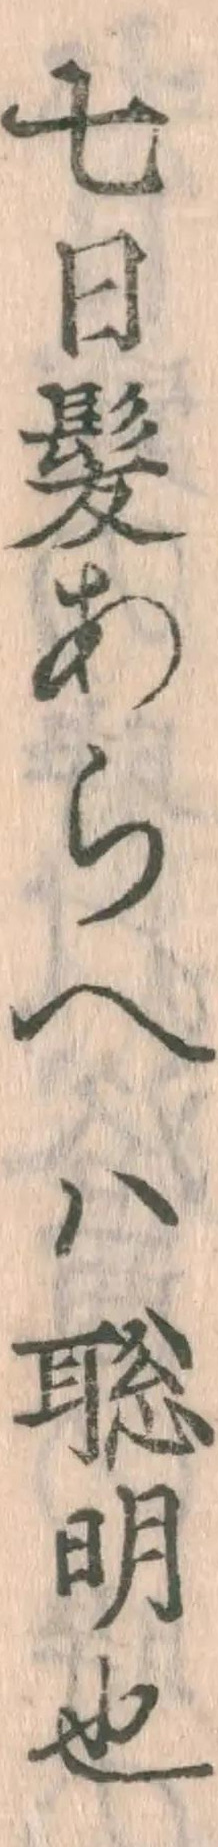七日髪あらへは聡明也
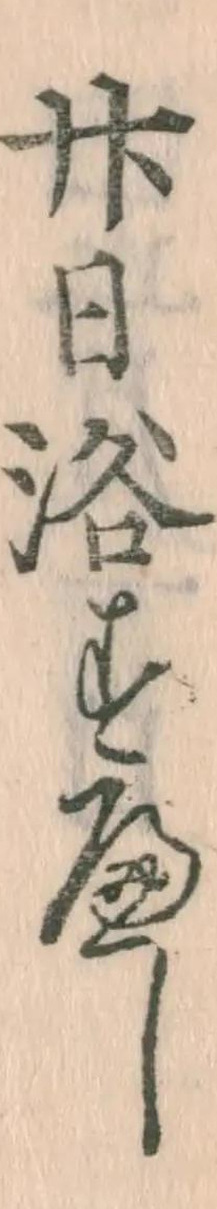廿日浴すへし
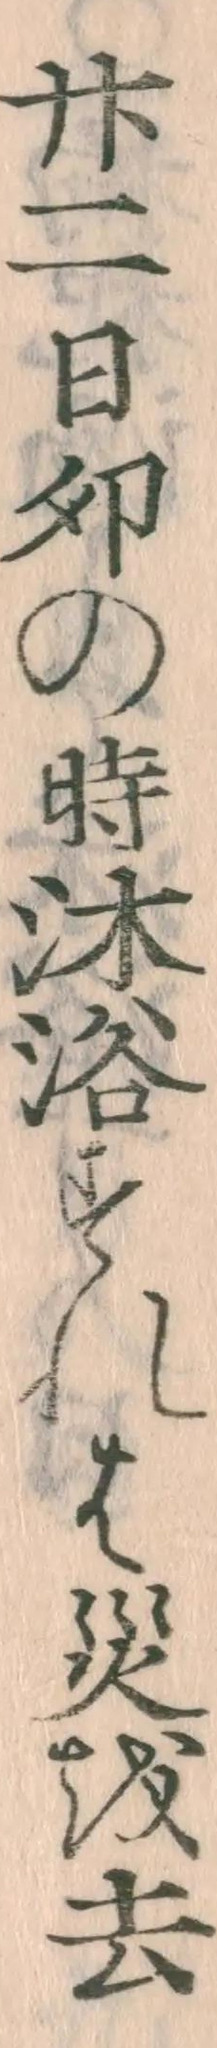廿ニ日卯の時沐浴すれは災を去
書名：延壽撮要
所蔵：国立国会図書館 National Diet Library, JAPAN
